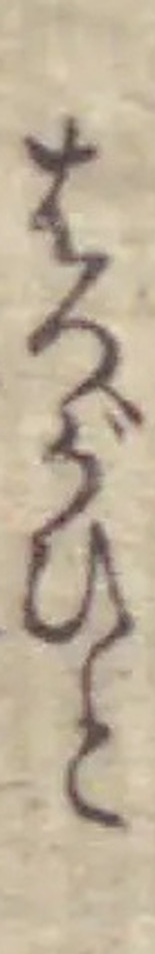はつがひと
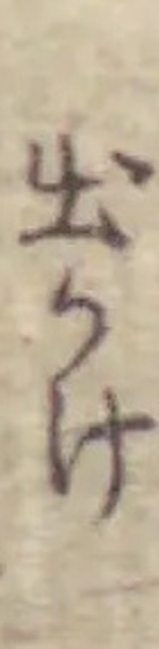出かけ
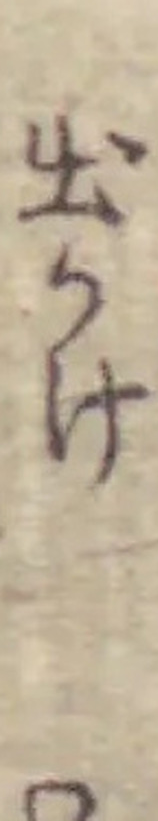出かけ
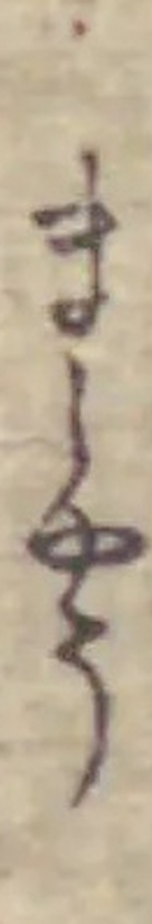ましやう
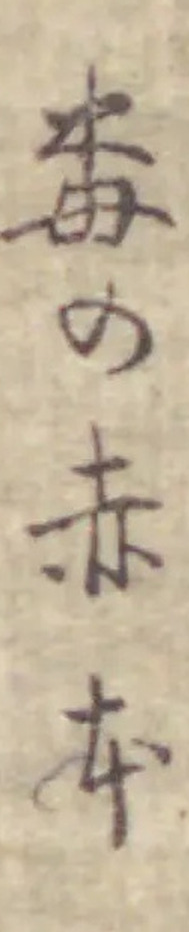毒の赤本
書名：化物敵討 2巻
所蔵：国立国会図書館 National Diet Library, JAPAN
